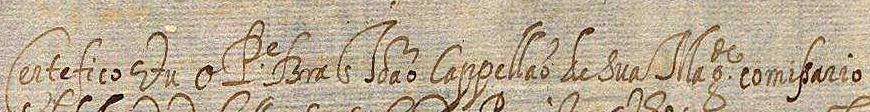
Certefico Eu o P.e Bras Ioão Cappellaõ de Sua Mag.de comissario
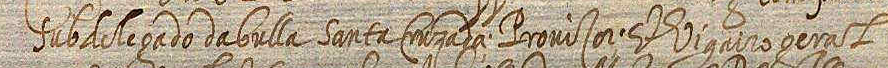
subdelegado da bulla Santa Cruzada Prouizor & Vigairo geraL
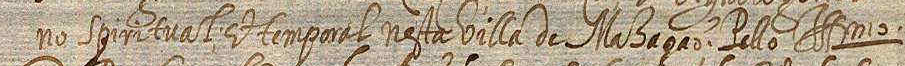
no spiritual & temporal nesta villa de Mazagaõ Pello Īllmo.
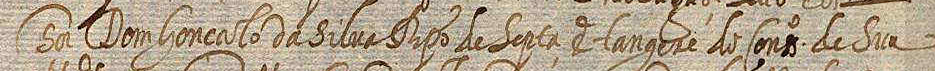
S̄or Dom Gonçalo da Silua Bpō de Septa, e tangere do Cons.o de Sua
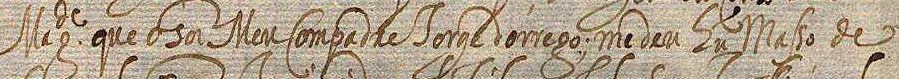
Mag.de que o s̄or Meu Compadre Iorge do rrego; me deu hū Masso de
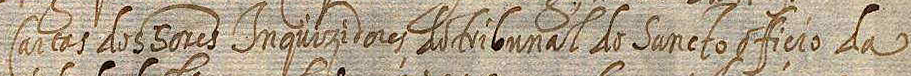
Cartas dos s̄ores Inquizidores do tribunal do Sancto officio da
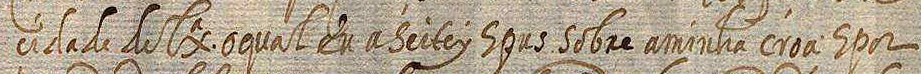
cidade de lxa. o qual eu aseitey E pus sobre a minha croa E por
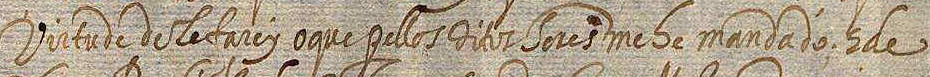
Virtude delatarey o que pellos ditos S̄ores me he mandado, E de
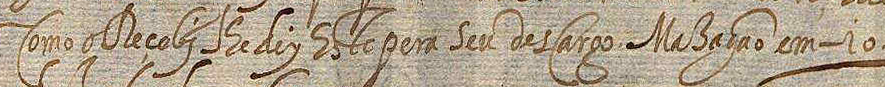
Como o Recebj lhe dey Este pera seu desCargo Mazagão em - 10 -
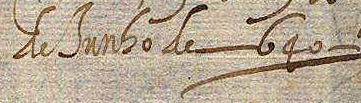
de Iunho de 640 -
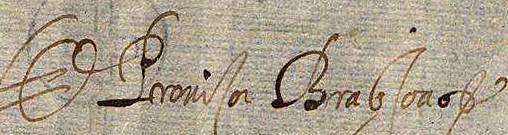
O Prouizor Bras Joao
